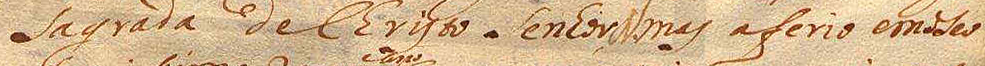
sagrada de Christo senhor N. mas aferio em o seo
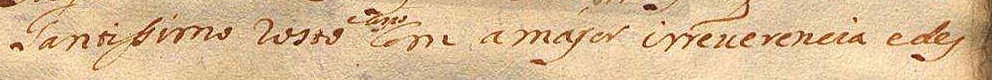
santissimo rosto e corpo com a mayor irreuerencia e des
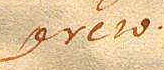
prezo.
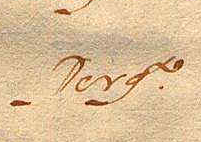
Porq.to
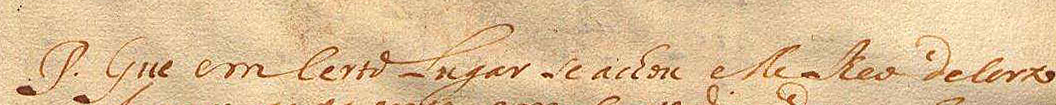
P. Que em Certo Lugar se achou elle Reo de certo
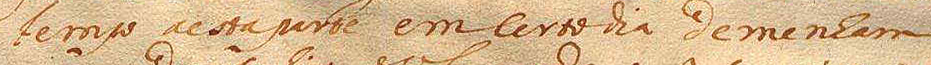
tempo a esta parte em certo dia de menham
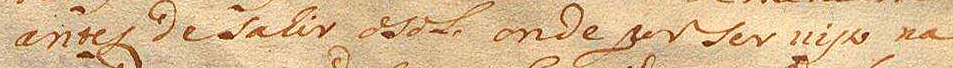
antes de sahir o sol onde por ser uisto na
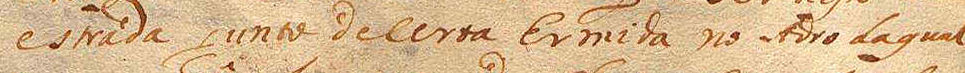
estrada junto de certa Ermida no Adro da qual
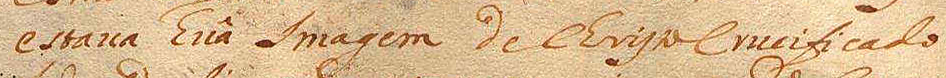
estaua huā Imagem de Christo Crucificado
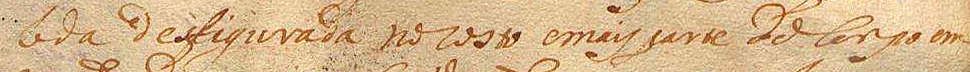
toda desfigurada no rosto e mais parte do Corpo em
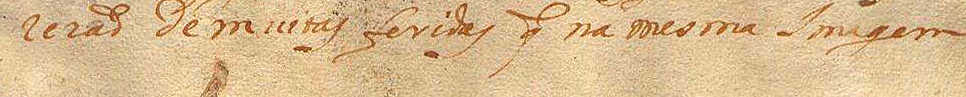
rezaõ de muitas feridas q̄ na mesma Imagem
